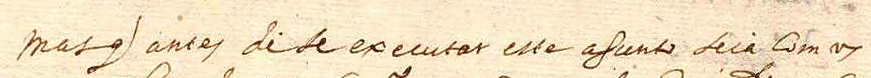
mas q̄ antes de se executar este assento seia com os
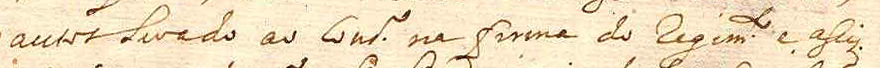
autos Levado ao Cons.o na forma do Regim.to e assis
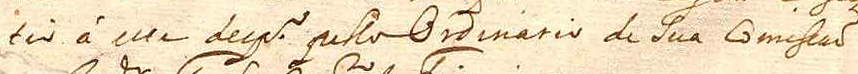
tio á este desp.o pello Ordinario de sua comissaõ
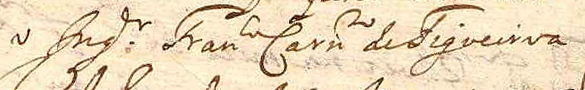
o Inq.or Franco Carnro de Figueiroa
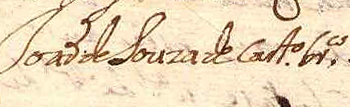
Joaõ de Souza de Cast.o br.co
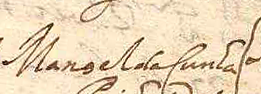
Manoel da Cunha
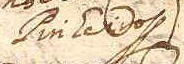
Pinheiro
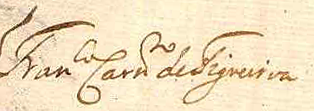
Fran.co Carn.ro de Figueiroa
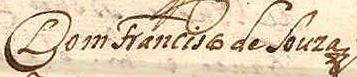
Dom Francisco de Souza
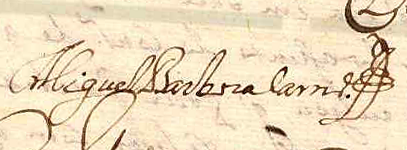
Miguel Barboza Carnro
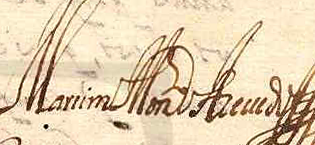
Martim Montro Azeuedo
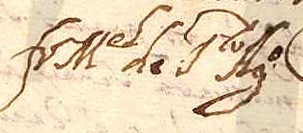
fr Mel de sto Ag.o
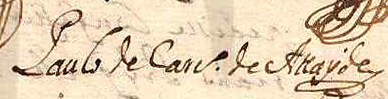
Paulo de Carv.o de Atayde
